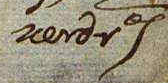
uerdros
